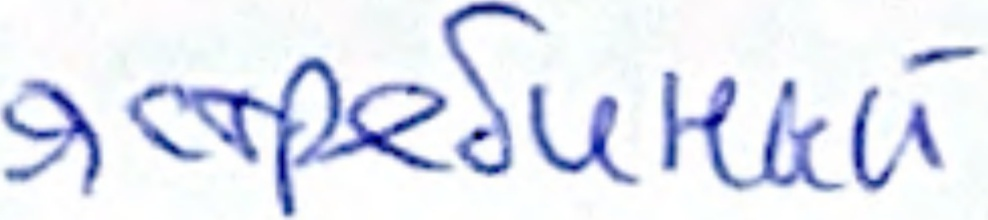ястребиный
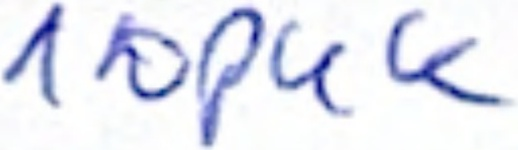люрик
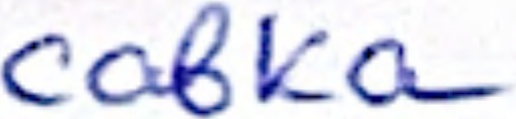савка
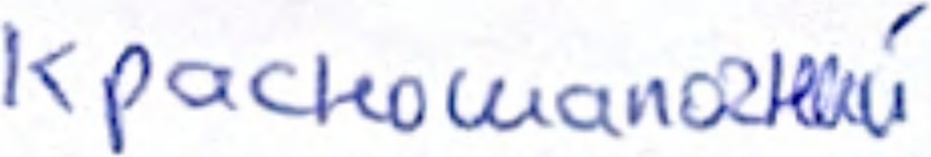красношапочный
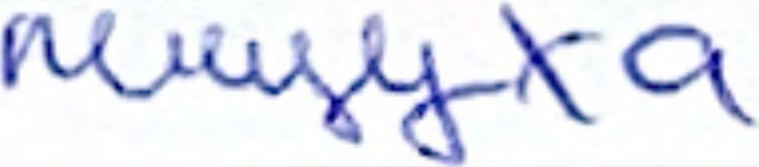пищуха
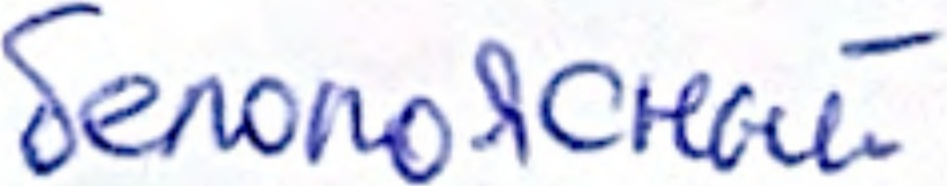белопоясный
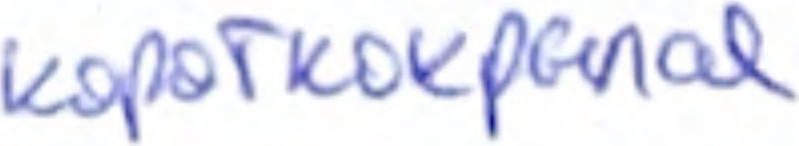короткокрылая
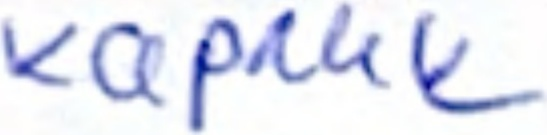карлик
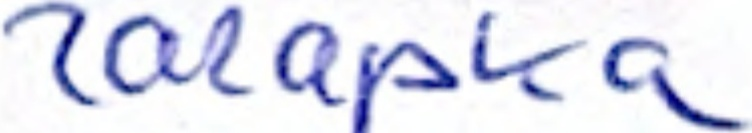гагарка
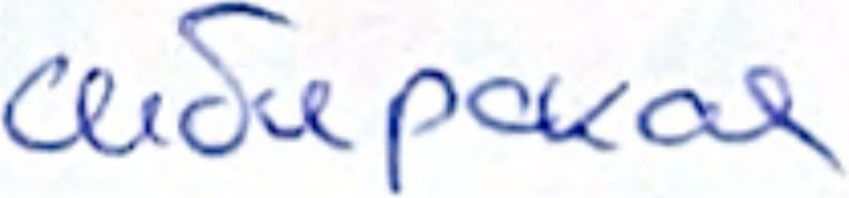сибирская
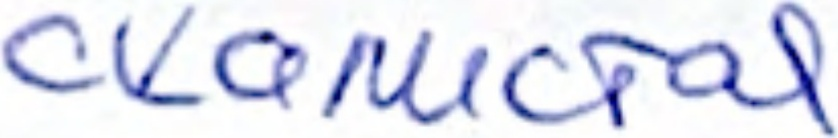скалистая
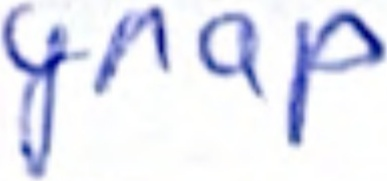улар
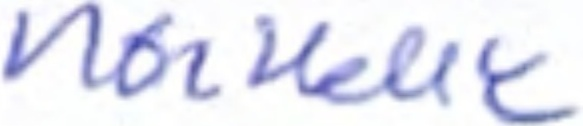пыжик
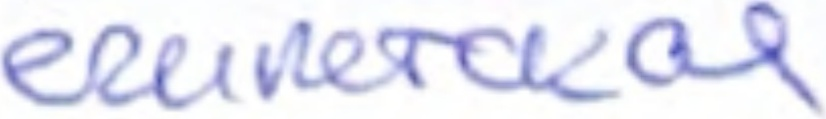египетская
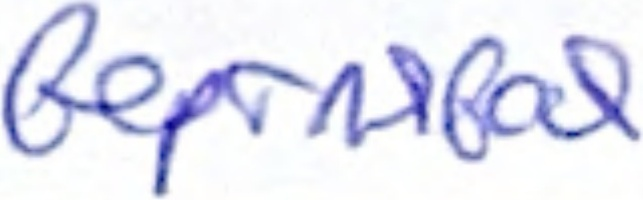вертлявая
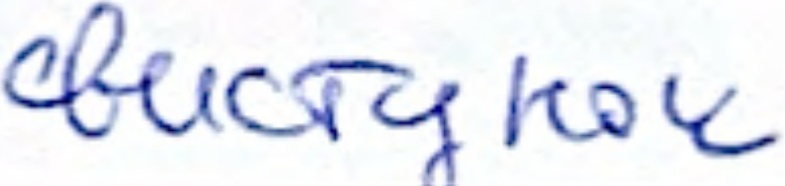свистунок
